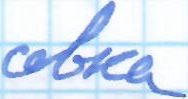совка
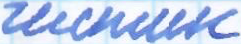чистик
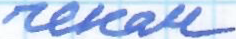чекан
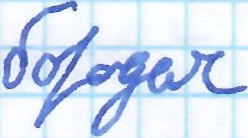бородач
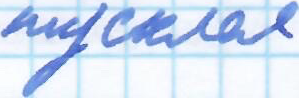тусклая
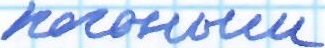погоныш
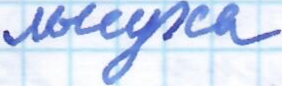лысуха
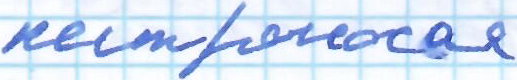пестроносая
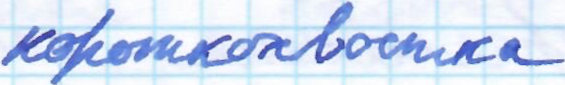короткохвостка
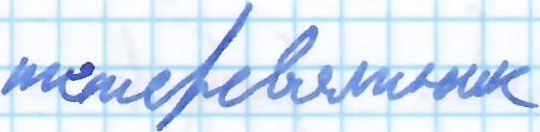тетеревятник
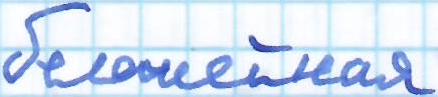белошейная
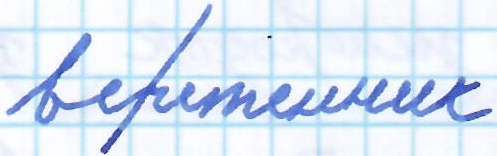веретенник
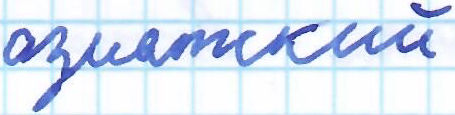азиатский
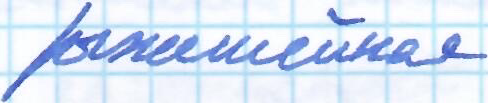рыжешейная
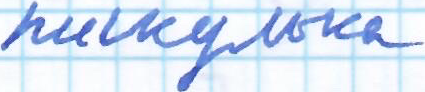пискулька
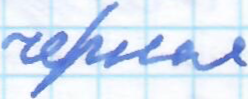черная
